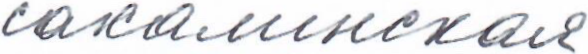сахалинская
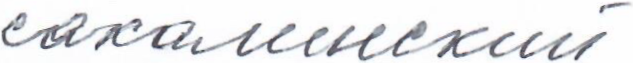сахалинский
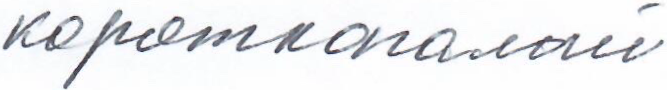короткопалый
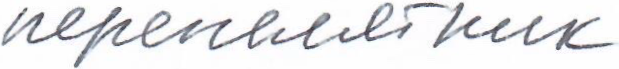перепелятник
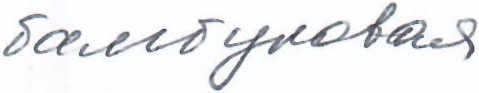бамбуковая
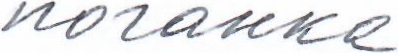поганка
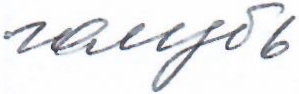голубь
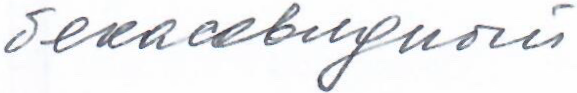бекасовидный
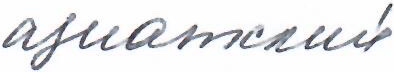азиатский
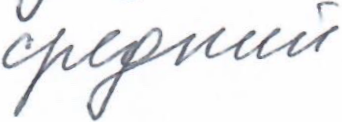средний
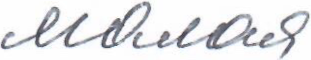малая
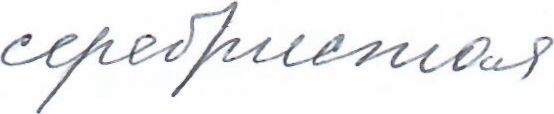серебристая
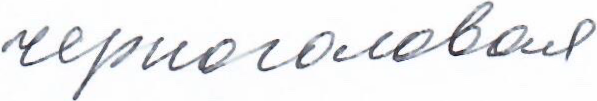черноголовая
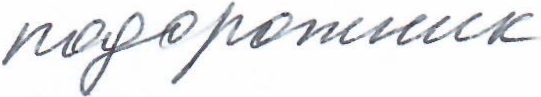подорожник
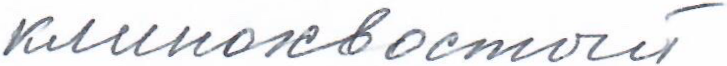клинохвостый
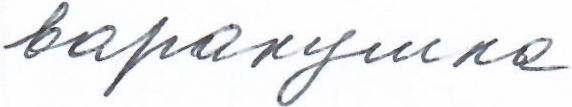варакушка
